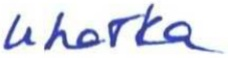ипотка
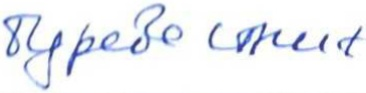буревестник
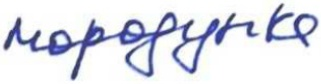мородунка
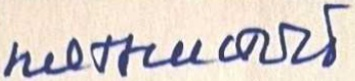пятнистый
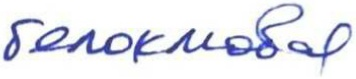белоклювая
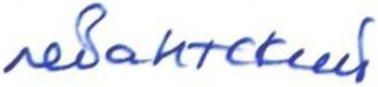левантский
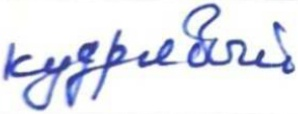кудрявый
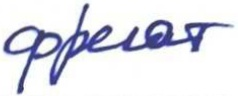фрегат
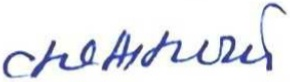снежный
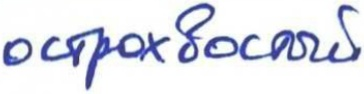острохвостый
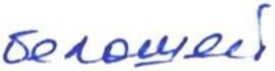белошей
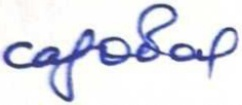садовая
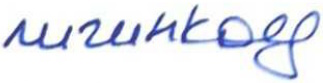личинкоед
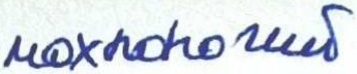мохноногий
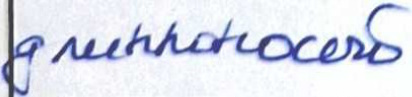длинноносый
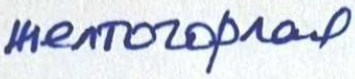желтогорлая
